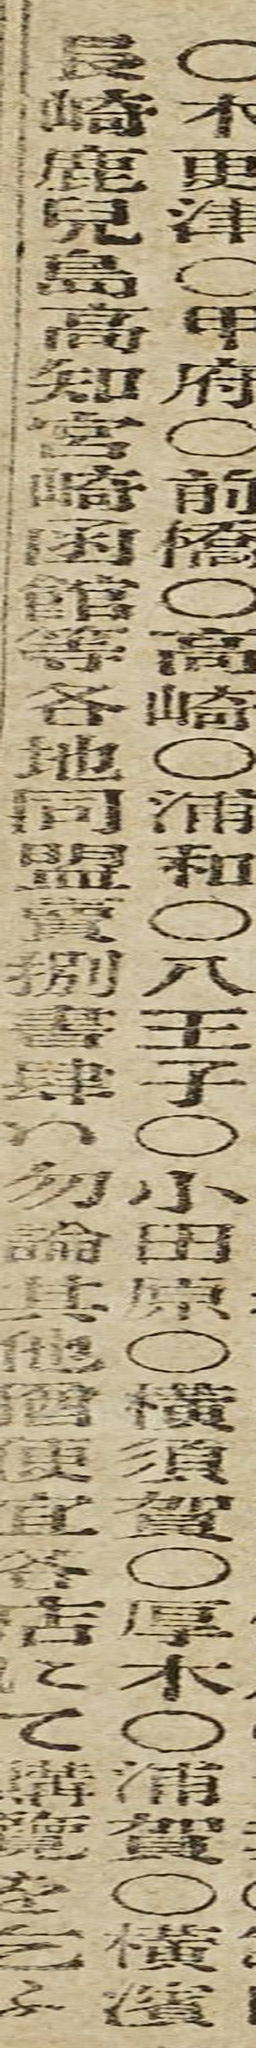長崎鹿児島高地宮崎函館等各知同盟売捌書肆は勿論其他猶便宜各店にて購覧を乞ふ

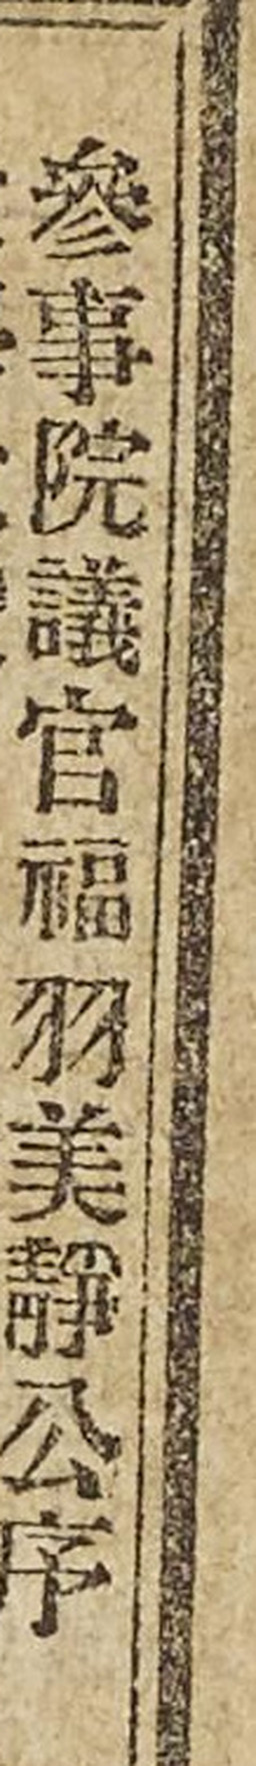参事院議官福羽美静公序
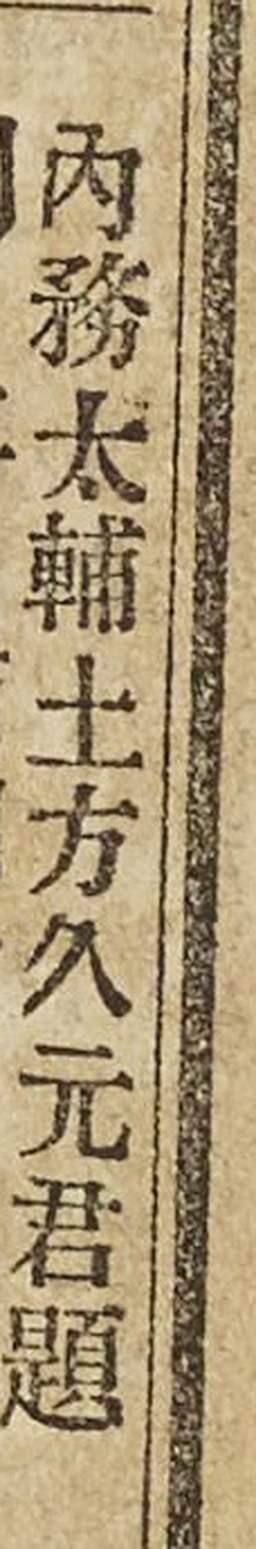内務太輔土方久元君題
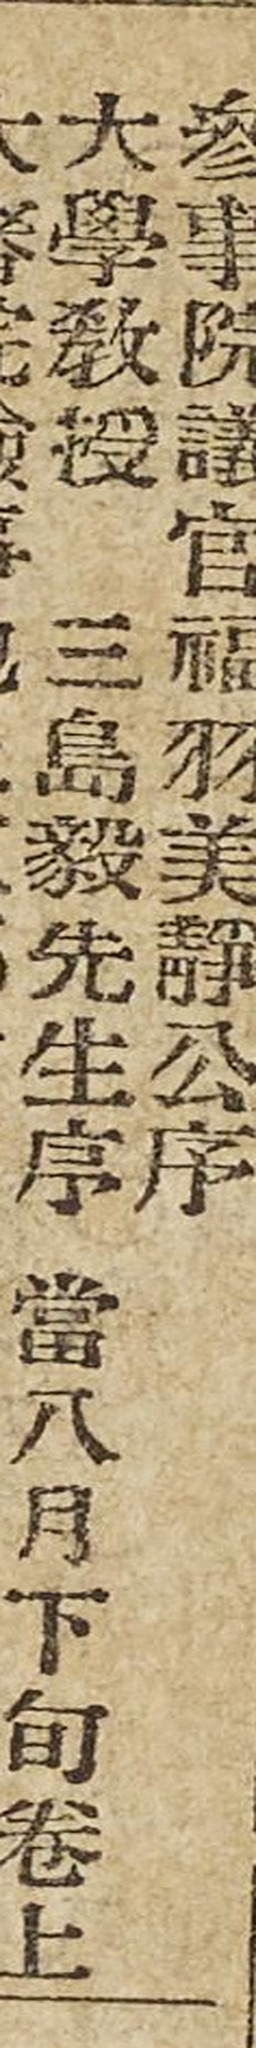大学教授三島毅先生序当八月下旬巻上
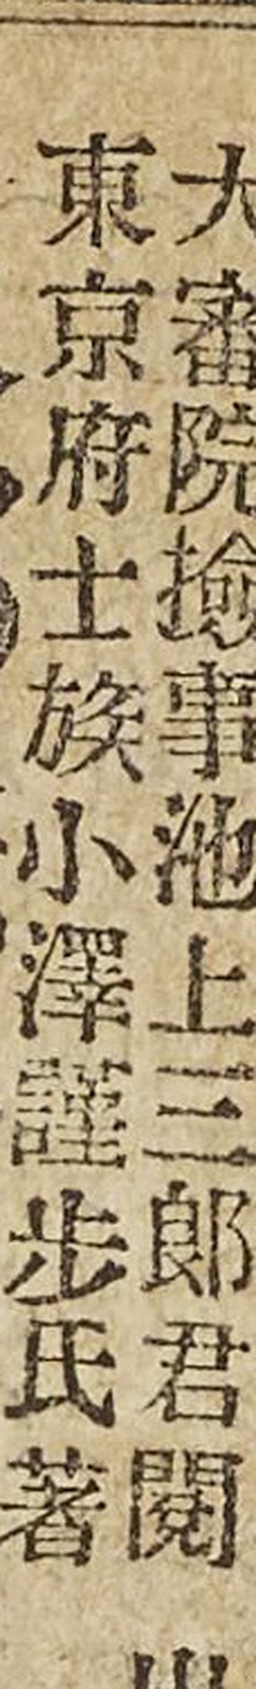東京府士族小澤謹歩氏著
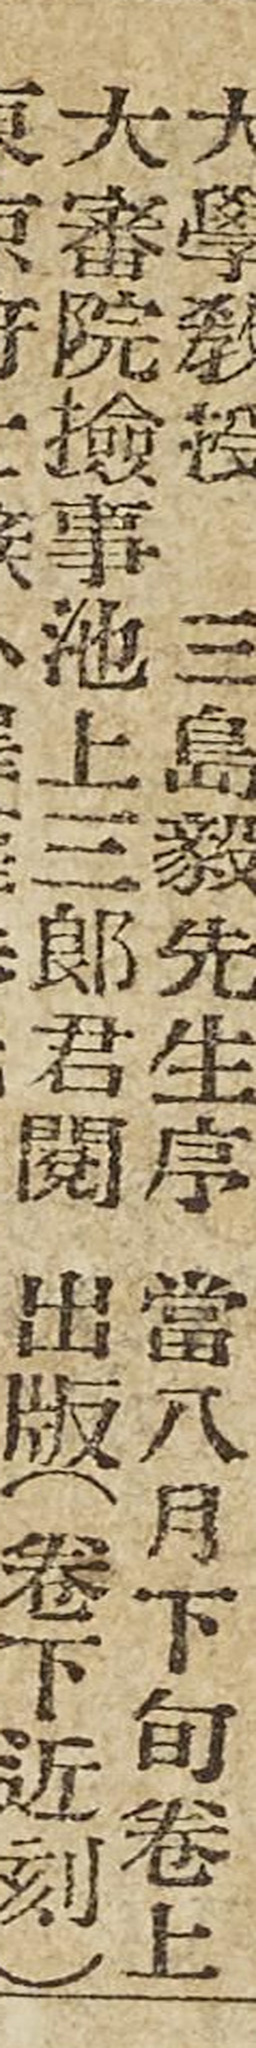大審院撿事池上三郎君閲出版
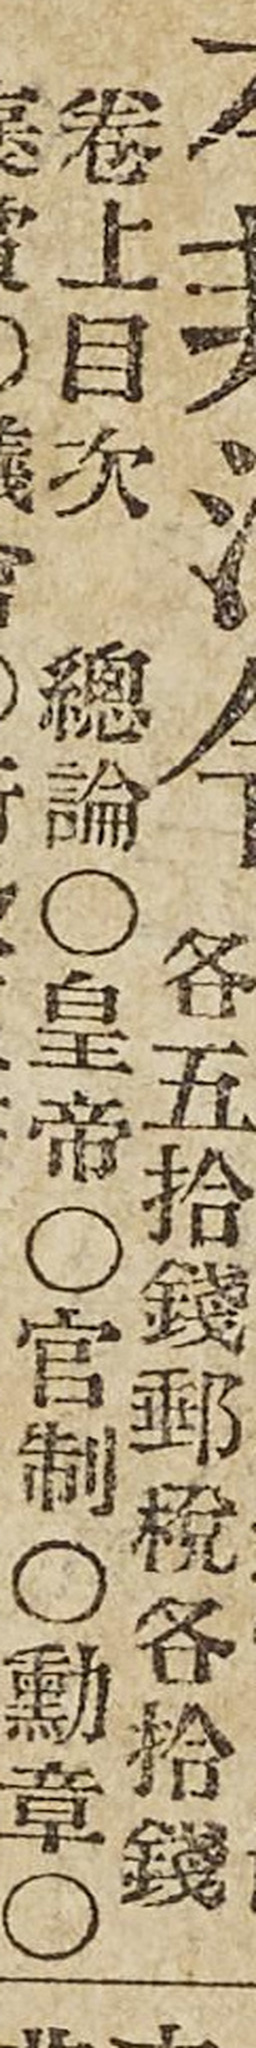巻上目次総論○皇帝○官制○勲章○
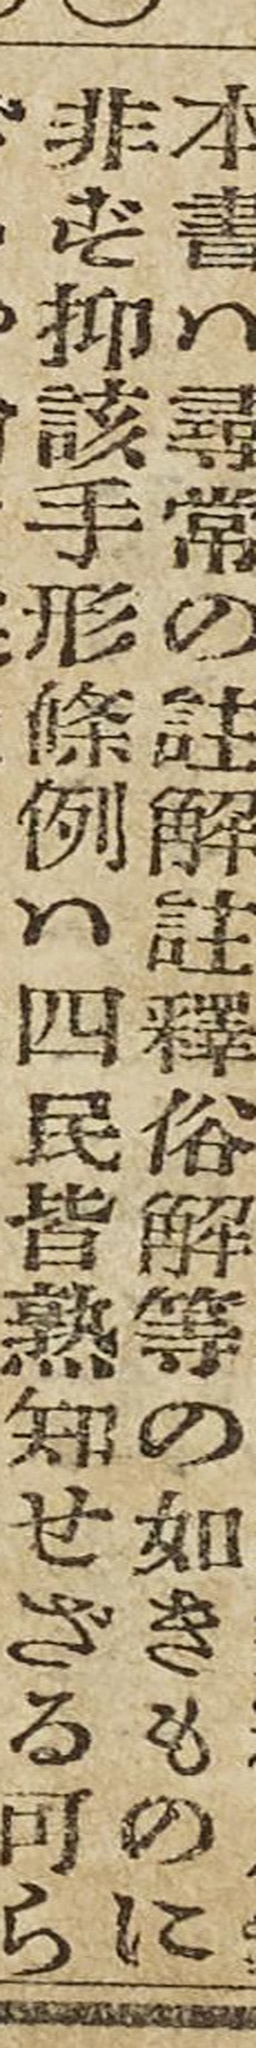非ず抑該手形條例は四民皆塾せざる可ら
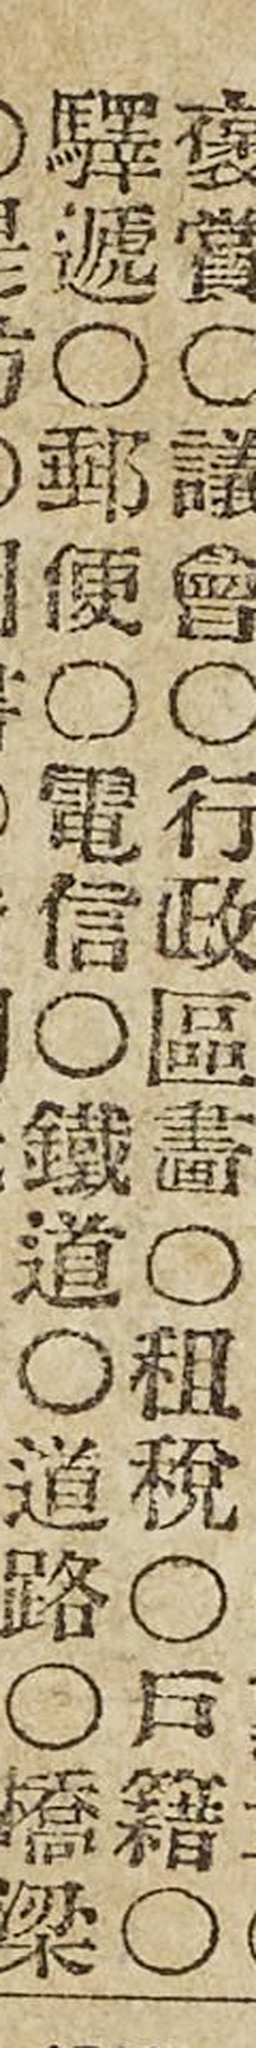駅逓○郵便○電信○鉄道○道路○橋梁
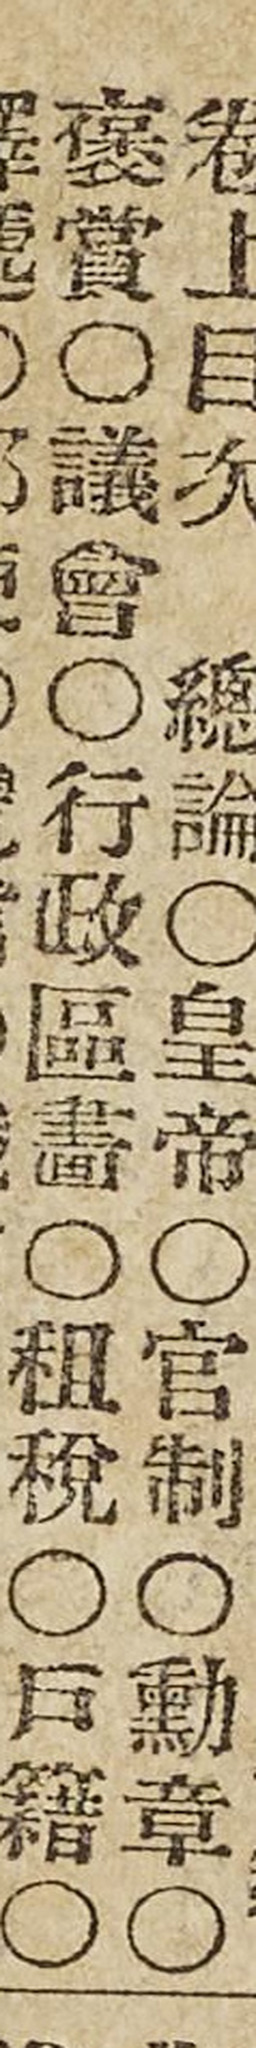褒賞○議会○行政区画○租税○戸籍○
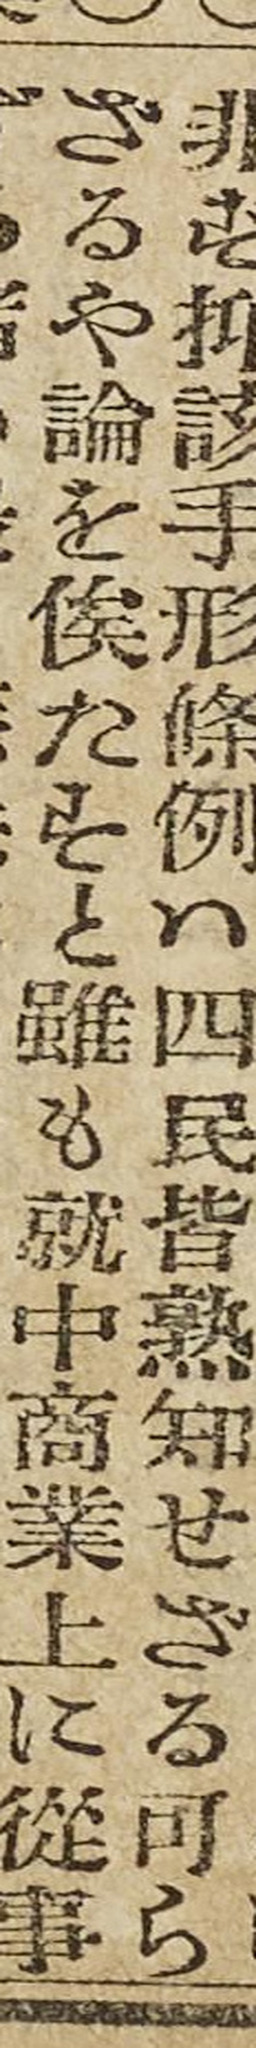ざるや論を挨たすと雖も就中商業上に従事
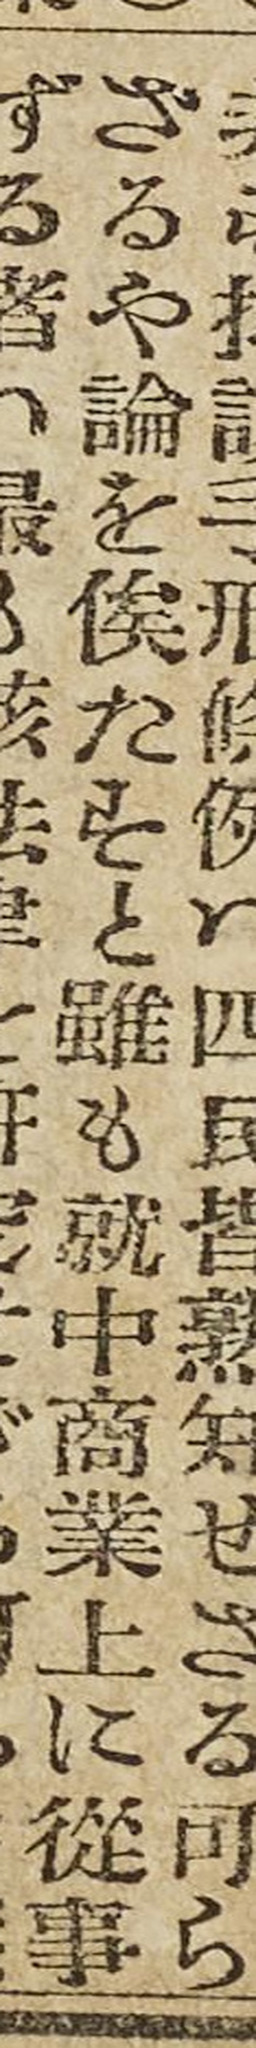ざるや論を挨たすと雖も就中商業上に従事
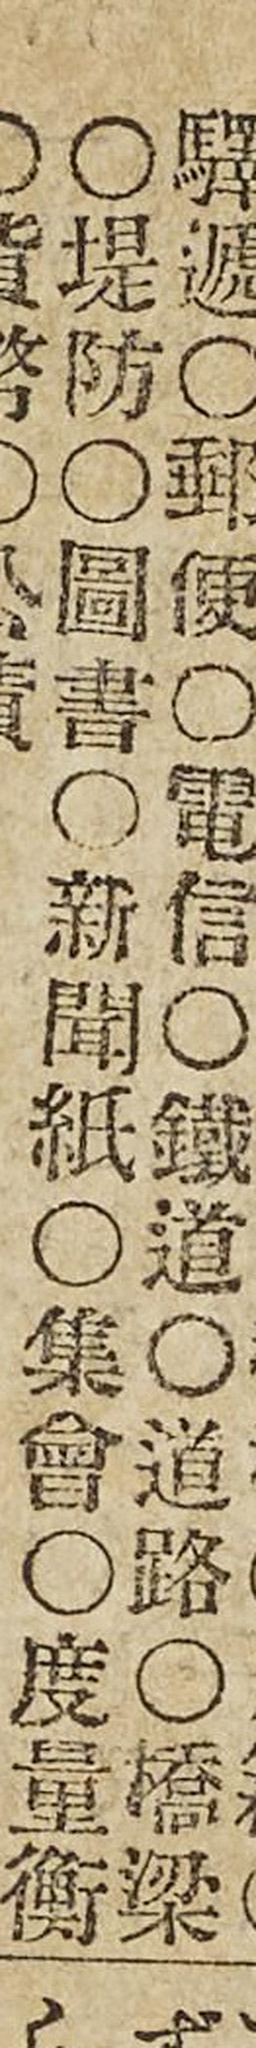○堤防○図書○新聞紙○集会○度量衡
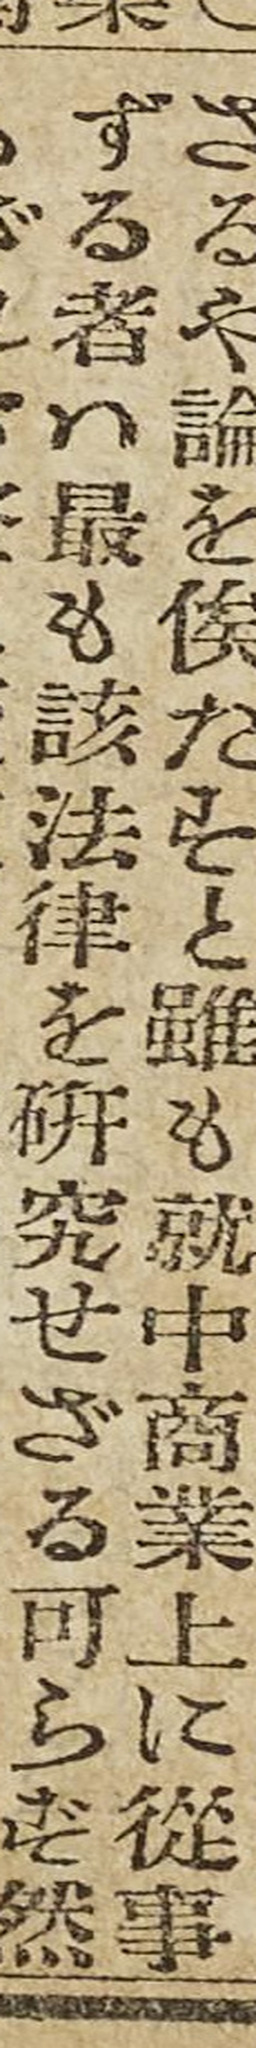ずる者は最も該法律を研究せざる可らず然
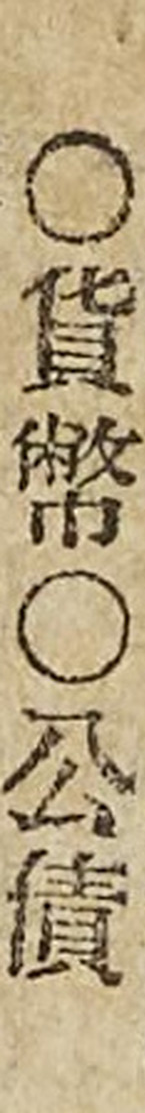○貨幣○公債
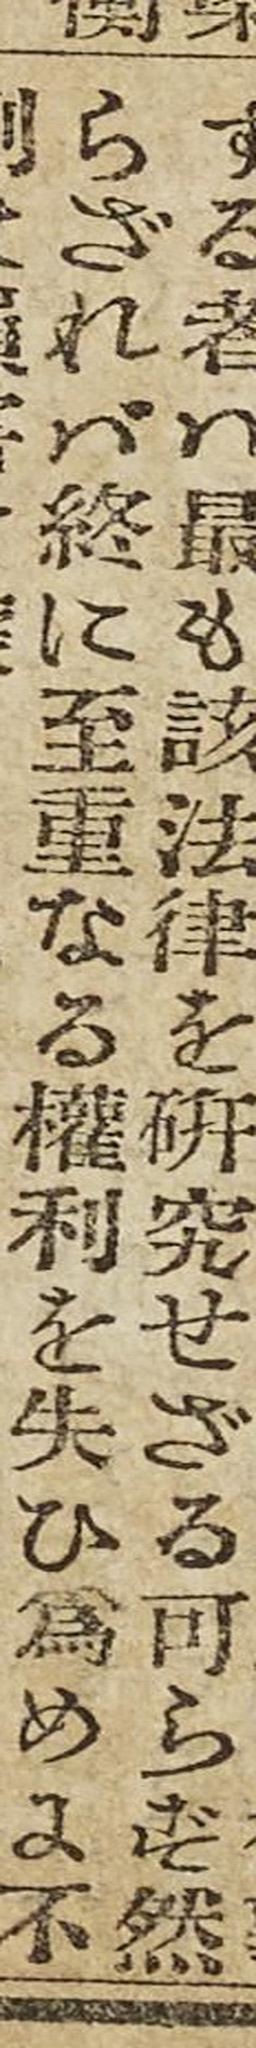らざれば終に至重なる権利を失ひ為めに不
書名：永代惨話　文化の夢　全
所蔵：東京大学地震研究所図書室 Earthquake Research Institute Library, The University of Tokyo, JAPAN
